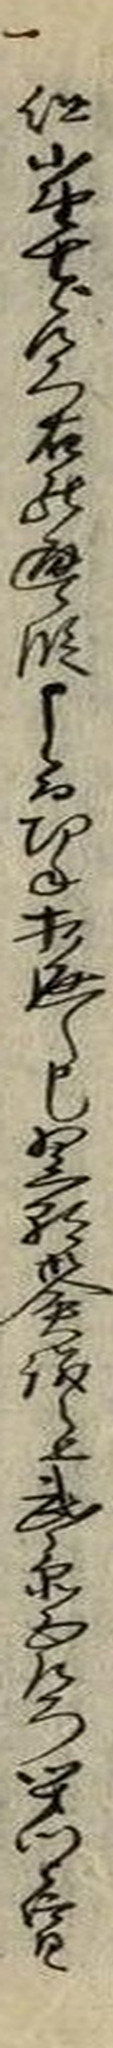但小野七郎左衛門右罷通候段申候而切手相返し申候翌朝御僉儀之上武兵衛五左衛門閉門被仰付候
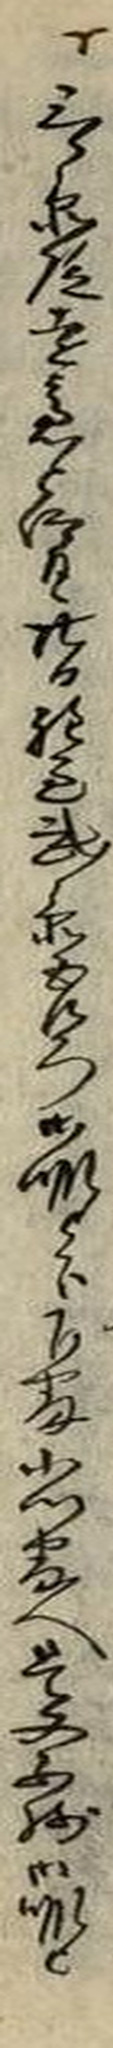三郎兵衛殿遠慮被仰付候廿日程過武兵衛五左衛門御暇被下下番小門番人是又不残御暇被
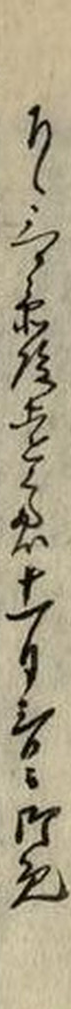下候三郎兵衛殿遠慮十一月三日に御免
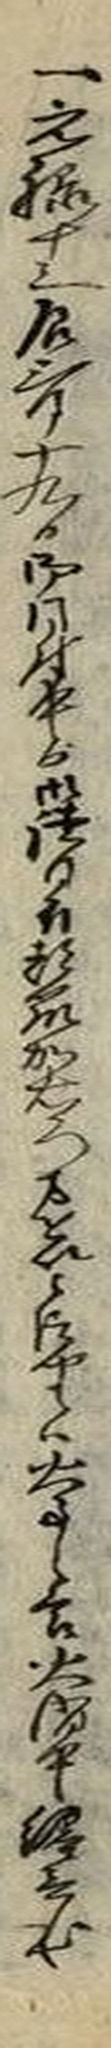一元禄十三辰三月十九日御目付中ゟ御徒目付都筑加右衛門方を以被仰聞候は火事之節火消中纏壱本
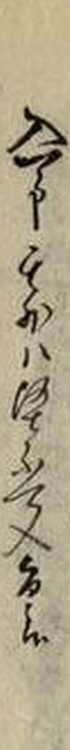入可申其外は堅不可入旨に候
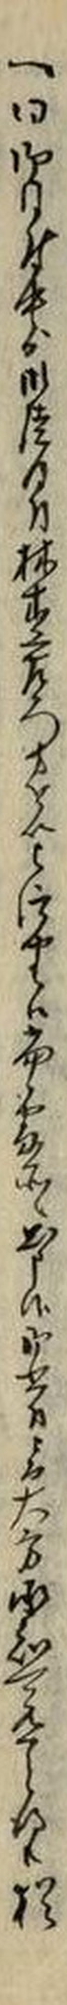一同御目付中ゟ御徒目付林木工左衛門方を以被仰聞候は南御番所へ出申候御書付にて大方承知可有之候得は猶
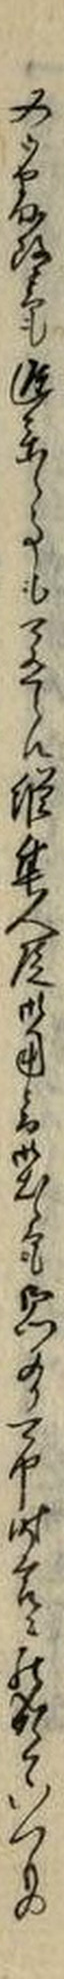又御番改にても通参候事も可有之候縦隼人殿御用にて御出候ても御門〆り可申時節に罷成候はゝいつもの
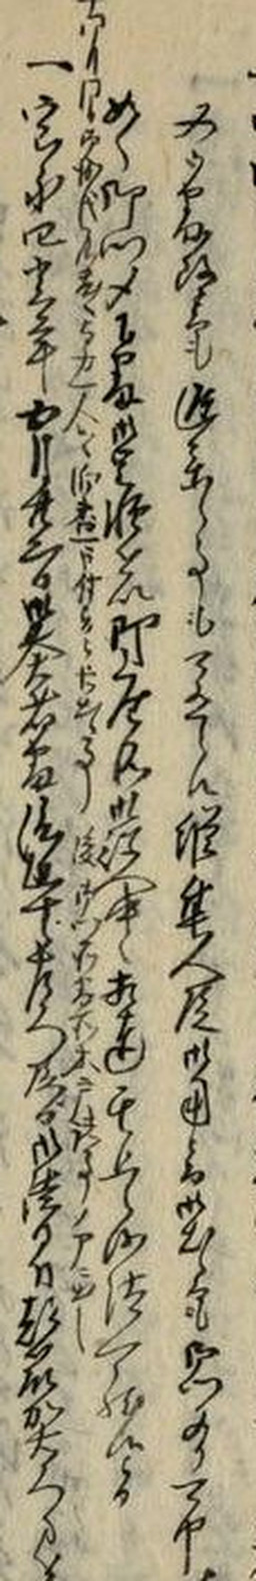如く御門〆下番御足軽を以御座所御役人中へ相達其上沙汰可致候旨
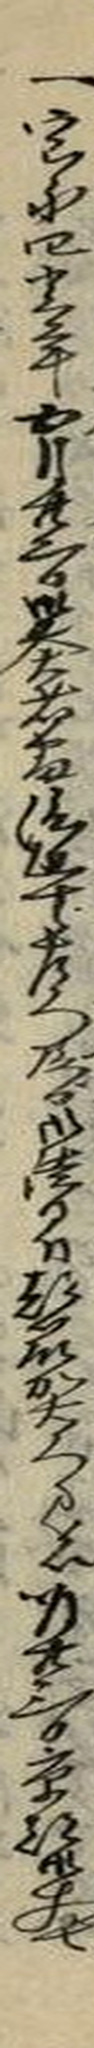一宝永四亥年五月廿二日御奏者番渡辺十郎左衛門殿ゟ御徒目付都築筑加右衛門方を以明廿三日京都御使者
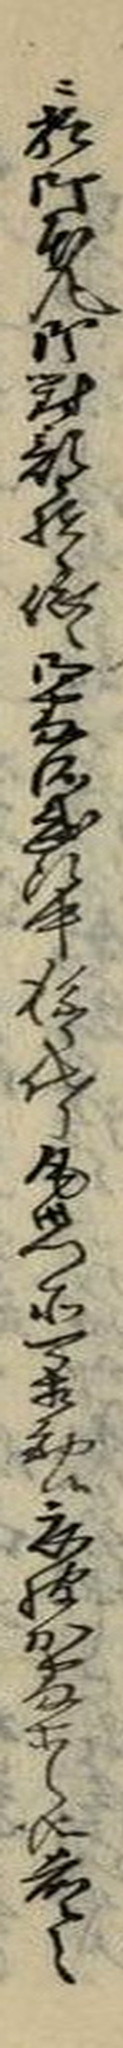に於御本丸御対顔被遊候依之御番所武頭中移り代り瓦御門所可相勤候衣服加番等之儀前々之
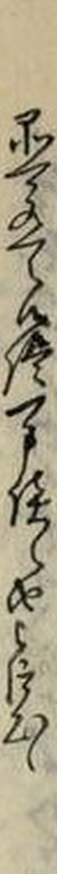品可有之候侭可申談候由被仰出候
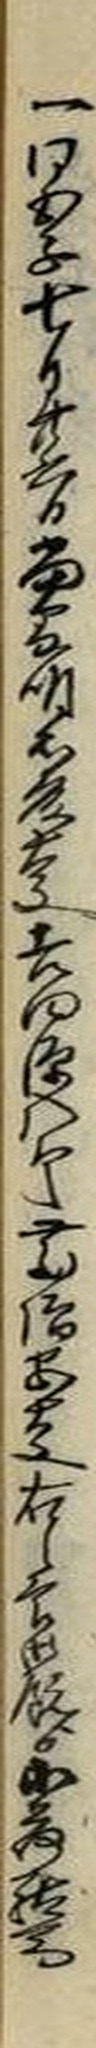一同五子七月廿六日当番明石藤太夫吉田源八郎慶増安太夫右之節御厩ゟ小荷駄馬
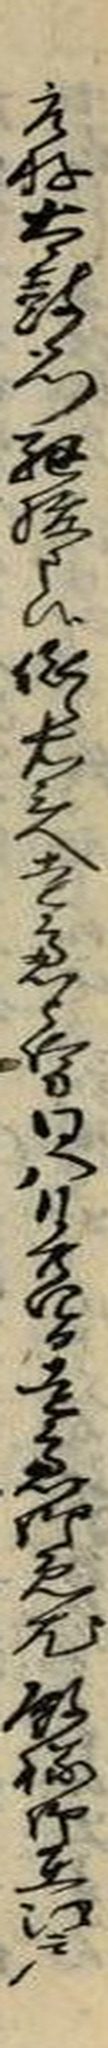取放太鼓御門駆抜申候依之右三人遠慮被仰付同八月廿四日遠慮御免尤殿様御在江戸
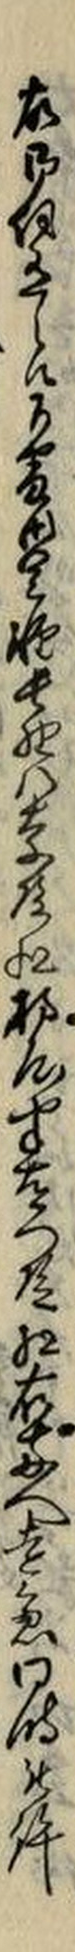故御任有之候下番御足軽長野八太夫殿組栃屋半左衛門殿組右両人遠慮同時被許
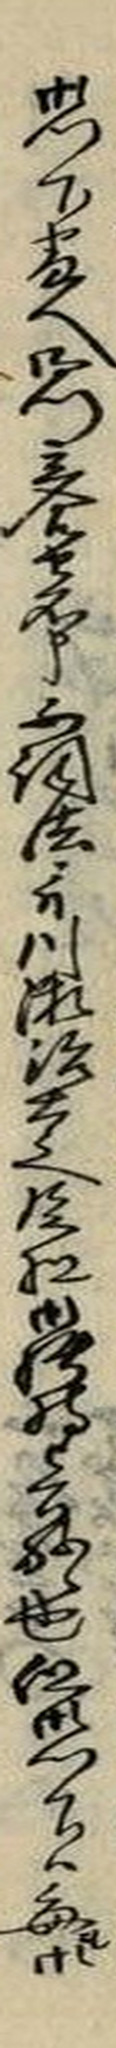御門下番人御門立合せ不申不調法に付川瀬治太夫殿組御扶持被召放候也但御門下は毎も御
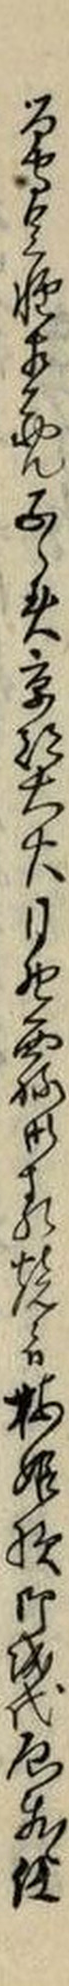留守足軽相勤ル子刻京都大火日野西様御類焼に付梅姫様御城代屋敷仮
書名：御門御櫓之部
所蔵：福井県文書館 Fukui Prefectural Archives
